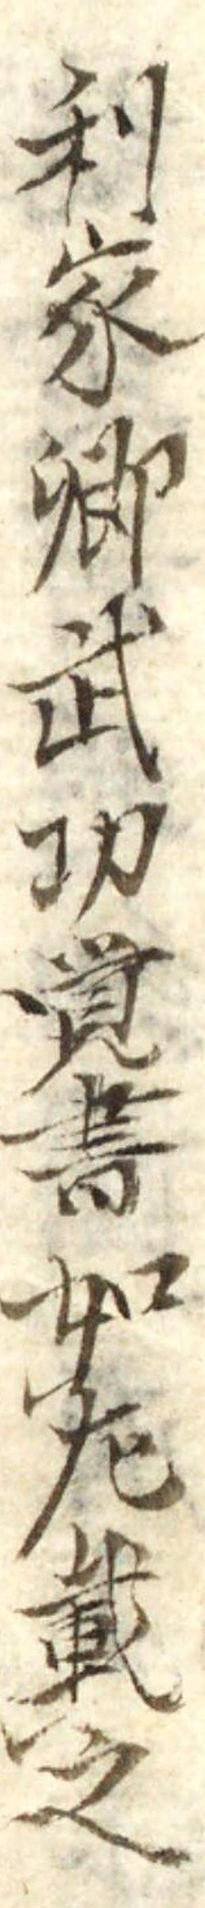利家卿武功覚書如左載之
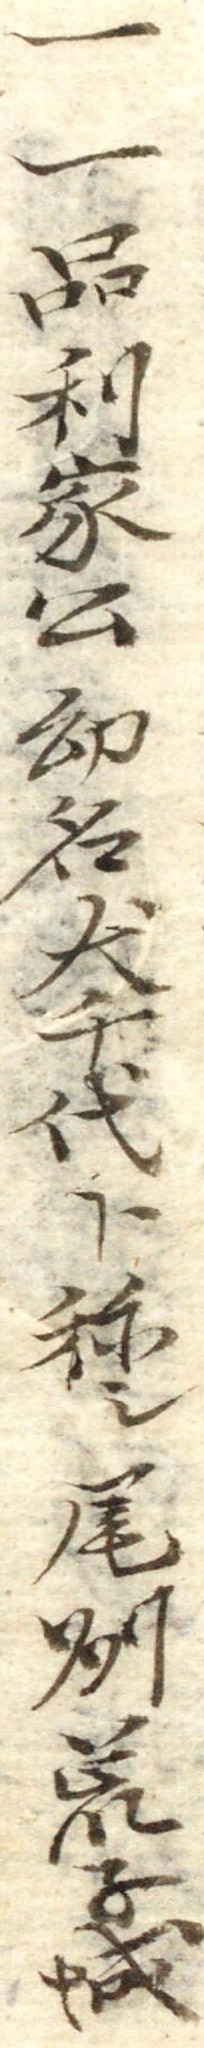一一品利家公幼名犬千代と称し尾州荒子域
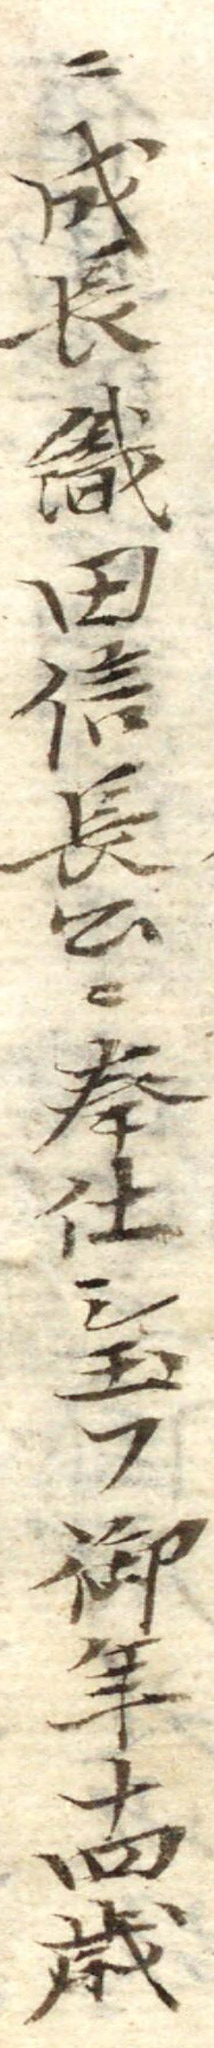に成長織田信長公に奉仕し玉ふ御年十四歳
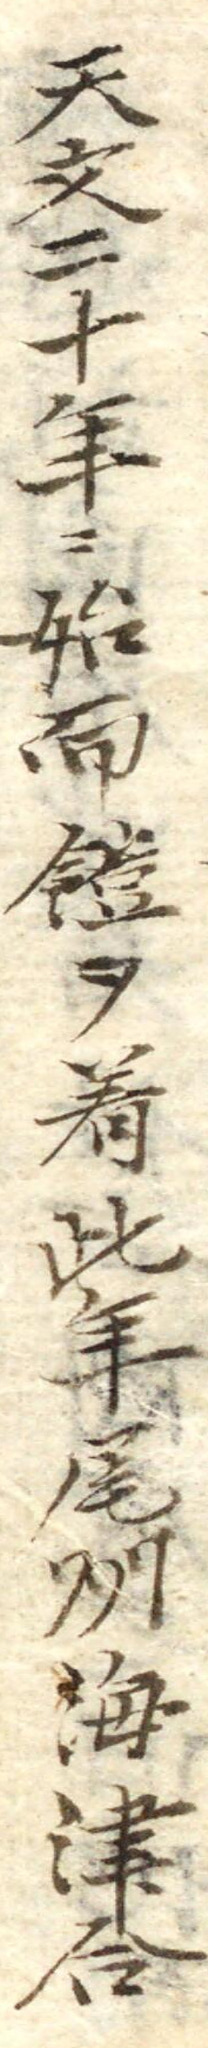天文二十年に始而鎧を着此年尾州海津合
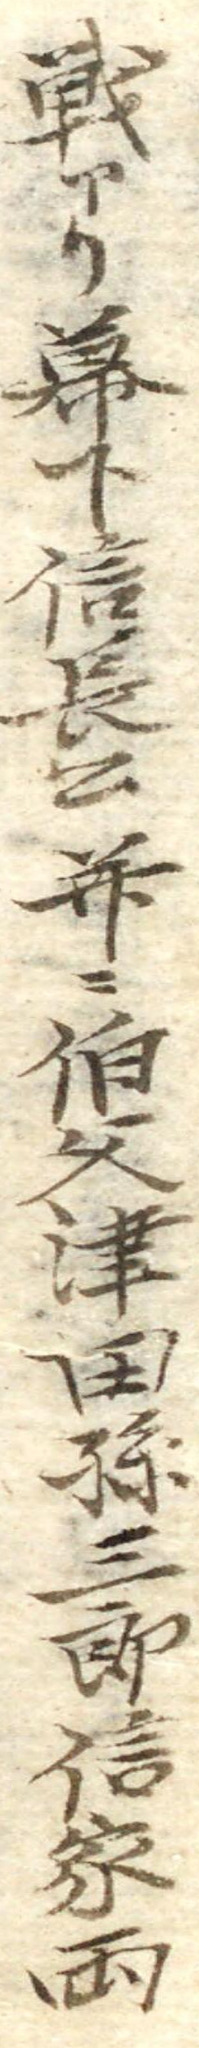戦あり幕下信長公幷に伯父津田弥三郎信家両
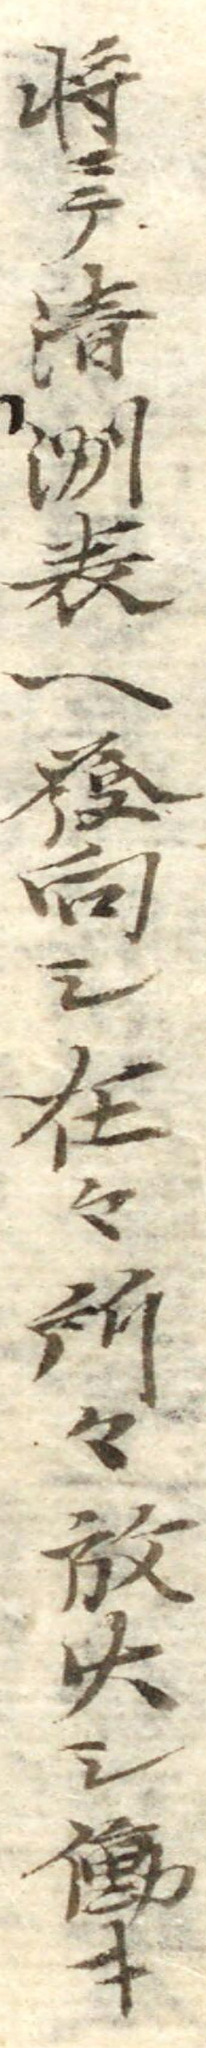将にて清洲表へ発向し在々所々放火し働き
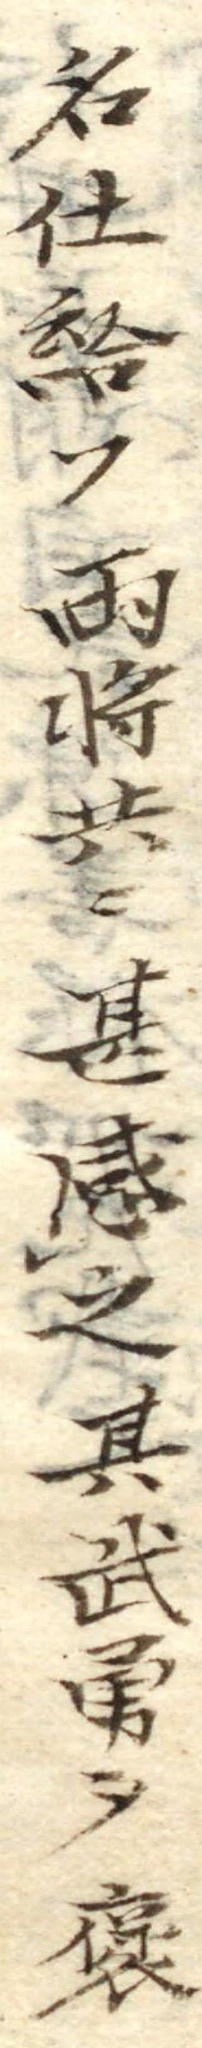名仕給ふ両将共には甚感之其武勇を褒
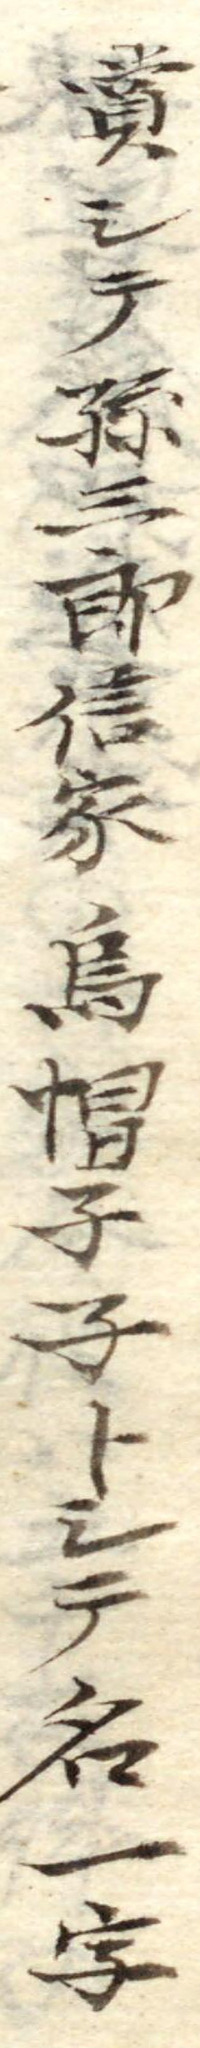賞して孫三郎信家烏帽子子として名一字
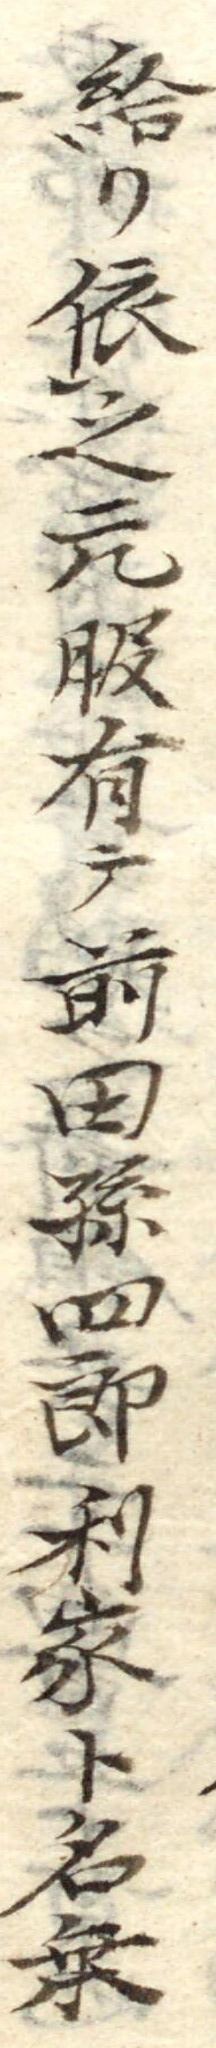給り依之元服有て前田孫四郎利家と名乗
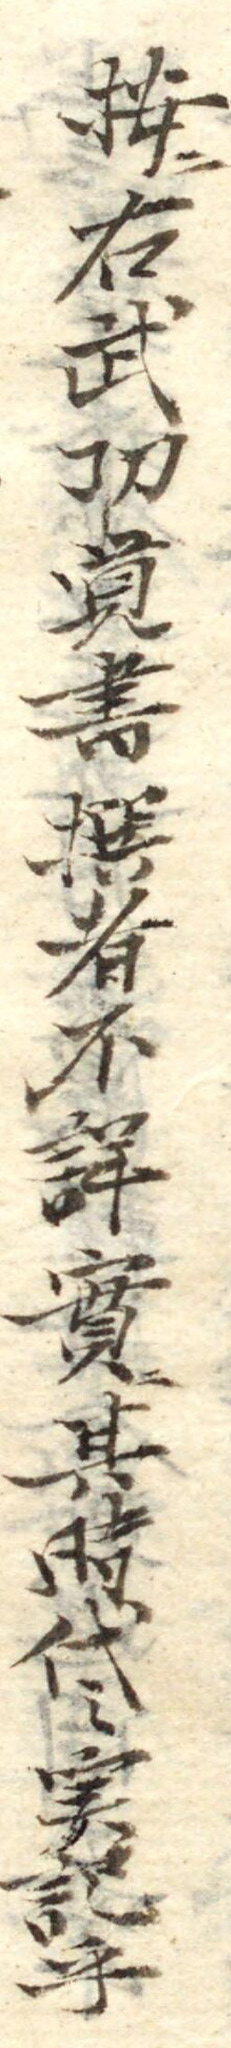按に右武功覚書撰者不詳實に其時代之実記乎
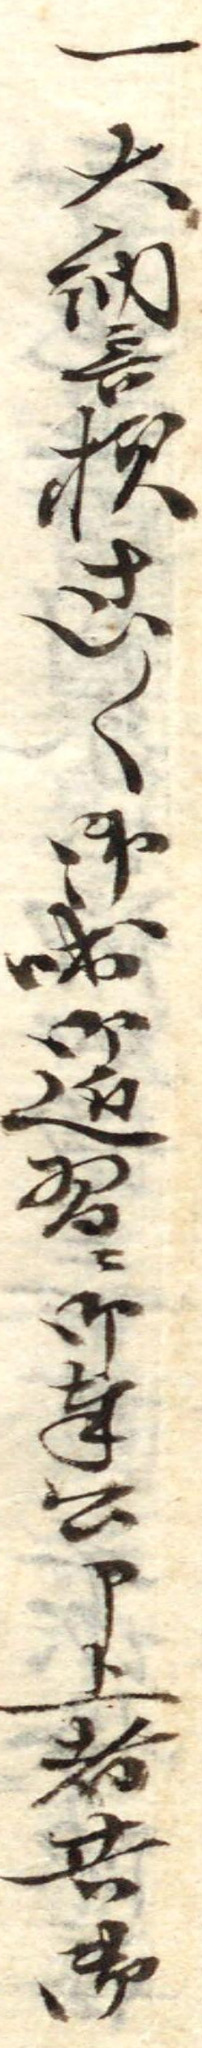一大納言様さい〳〵御咄御近習に御奉公申上者共御
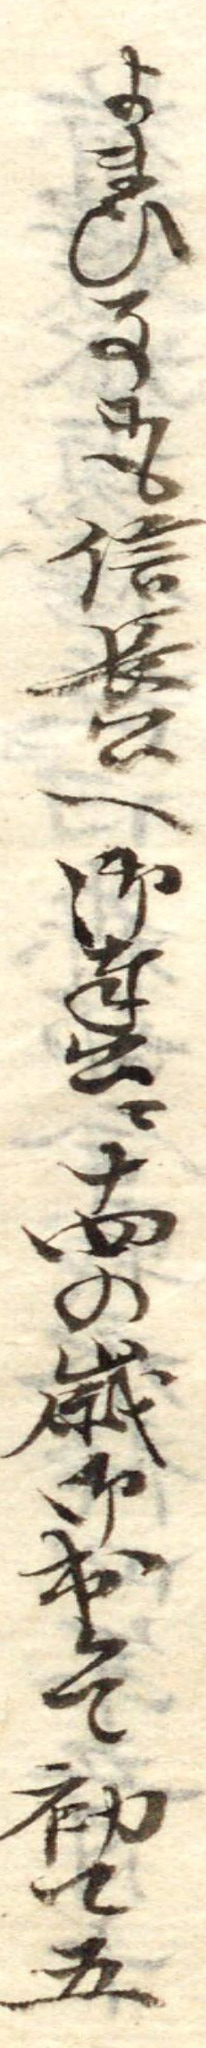よまひ事にも信長公へ御奉公に十四の歳御出候て初て五
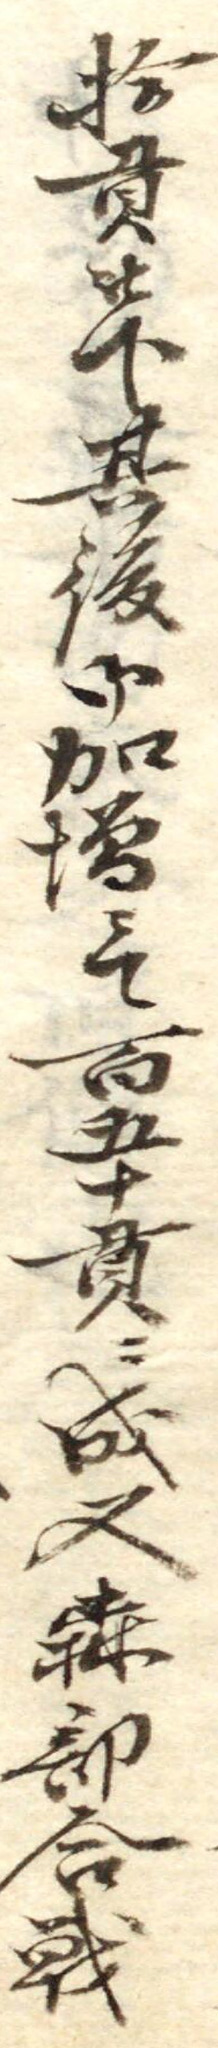拾貫被下其後御加増にて百五十貫に成又森部合戦
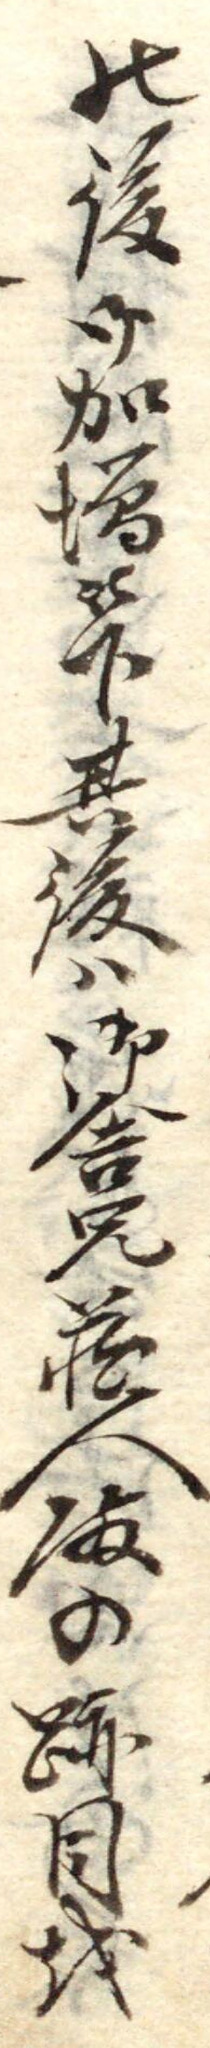能後御加増被下其後は御舎兄蔵人殿の跡目越
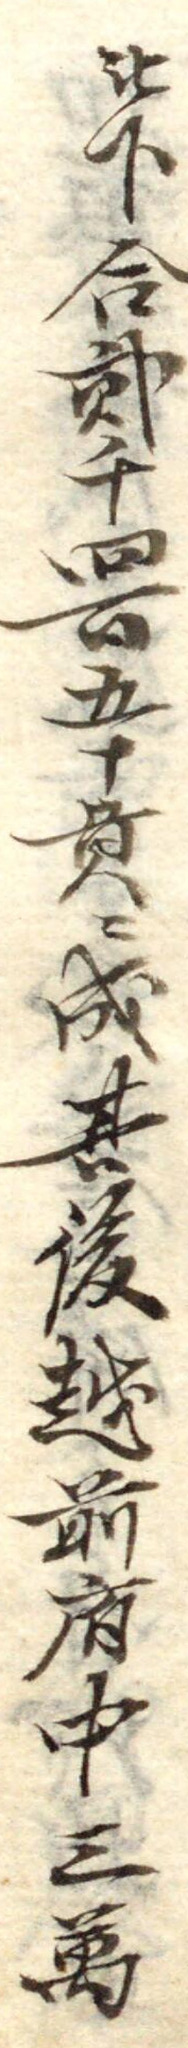被下合貳千四百五十貫に成其後越前府中三萬
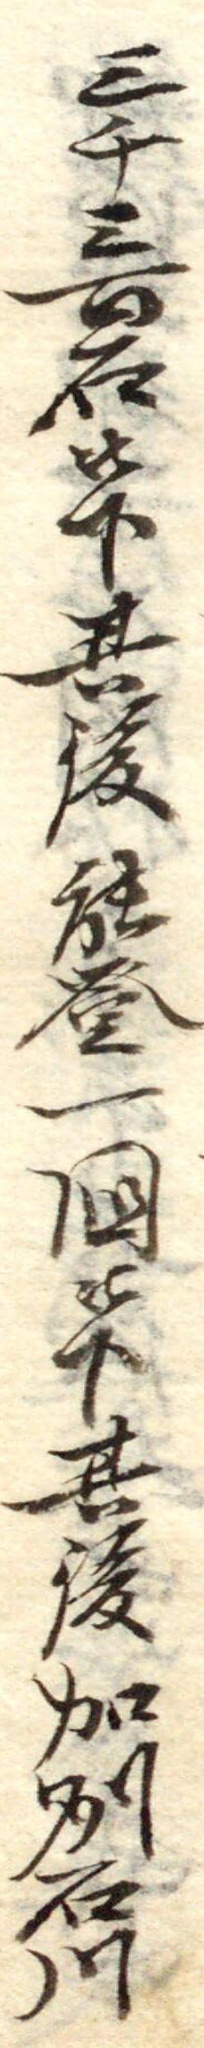三千三百石被下其後能登一国被下其後加州石川
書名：前田家封国証書集録
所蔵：Ishikawa Prefectural Library
